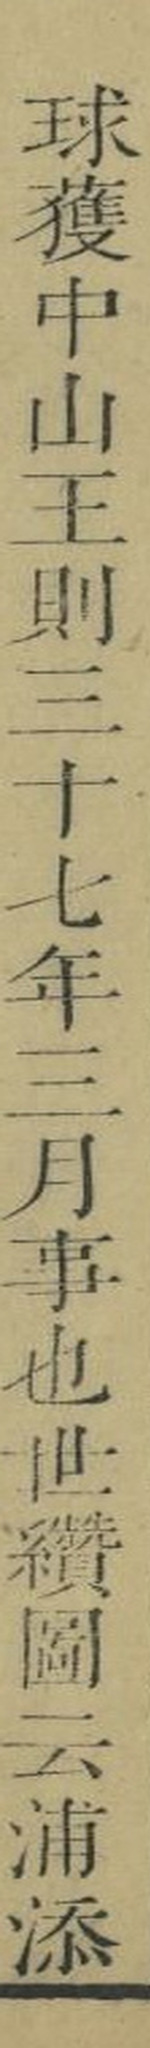球獲中山王則三十七年三月事也世纘図云浦添
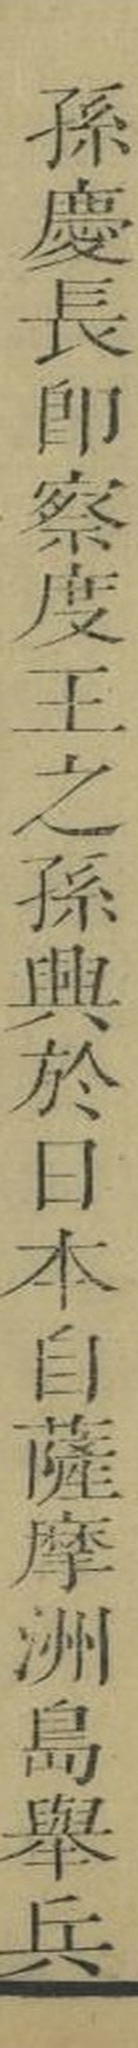孫慶長即察度王之孫興於日本自薩摩洲島挙兵

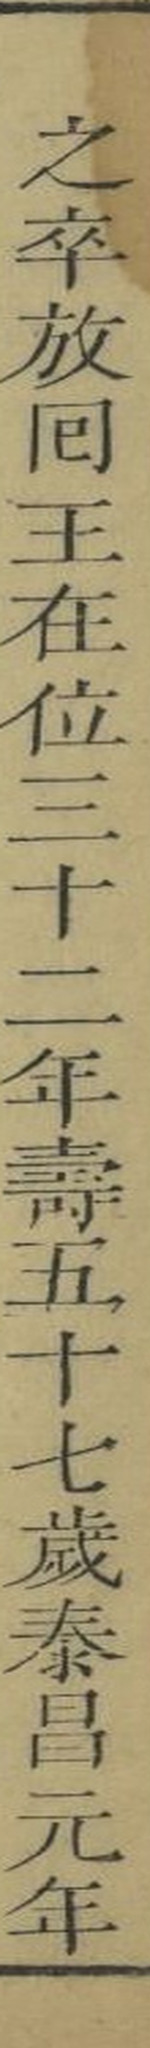之卒放回王在位三十二年寿五十七歳泰昌元年
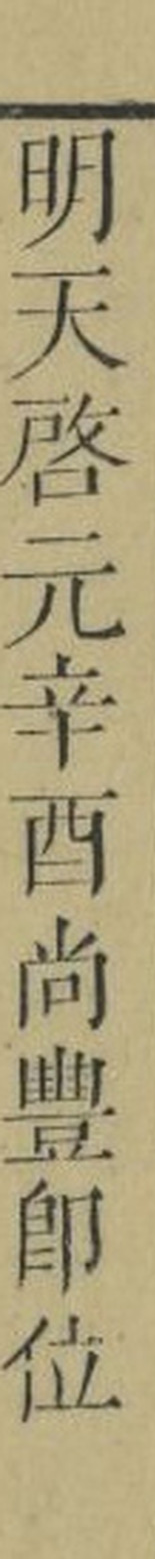明天啓元辛酉尚豊即位
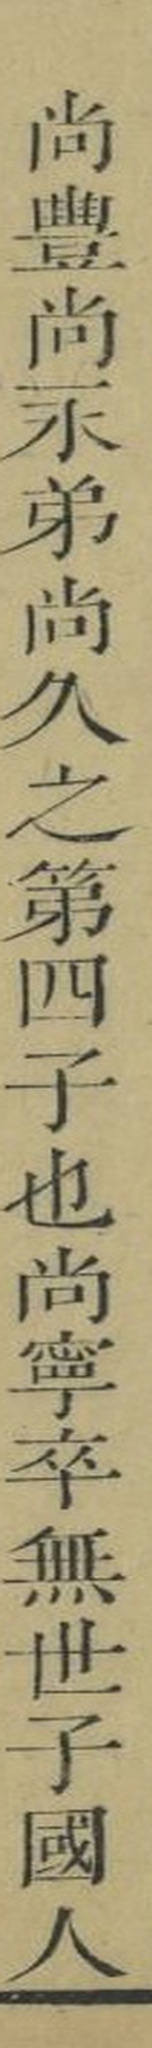尚豊尚永弟尚久之第四子也尚寧卒無世子国人
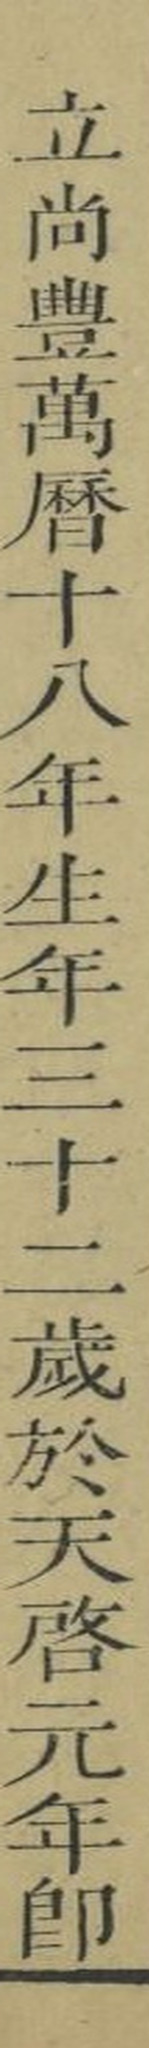立尚豊万暦十八年生年三十二歳於天啓元年即
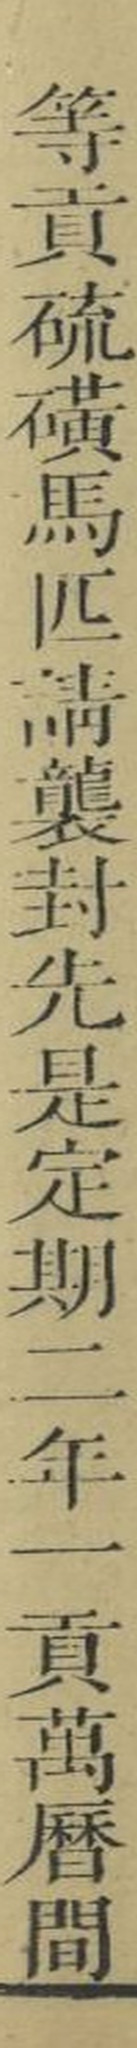等貢硫磺馬匹請襲封先是定期二年一貢万暦間
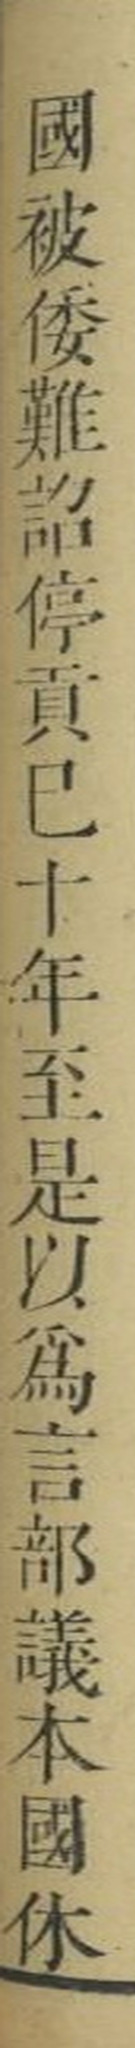国被倭難詔停貢巳十年至是以為言部議本国休
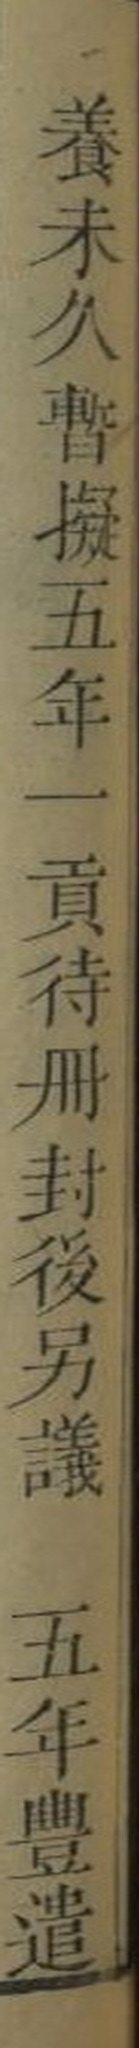養未久暫擬五年一貢待冊封後另議五年豊遣
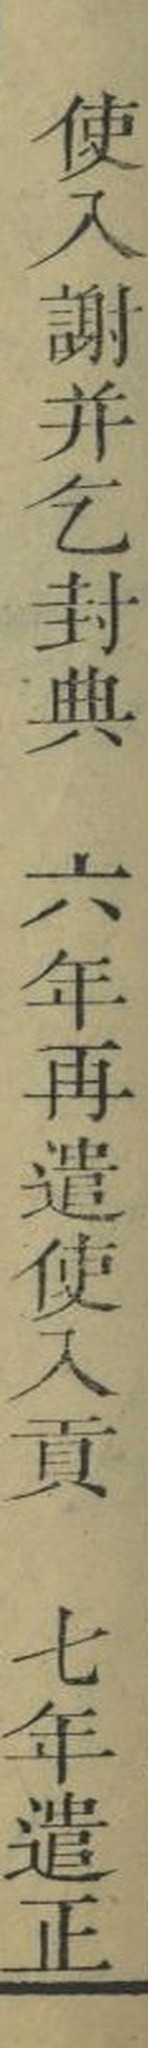使入謝并乞封典六年再遣使入貢七年遣正
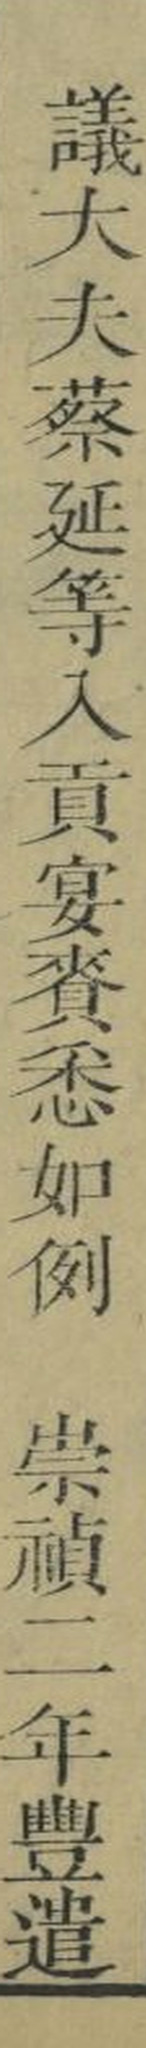議大夫蔡延等入貢宴賚悉如例崇禎二年豊遣
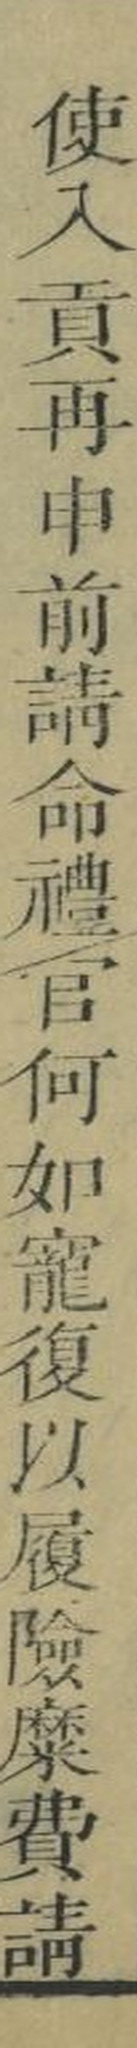使入貢再申前請命礼官何如寵復以履険糜費請
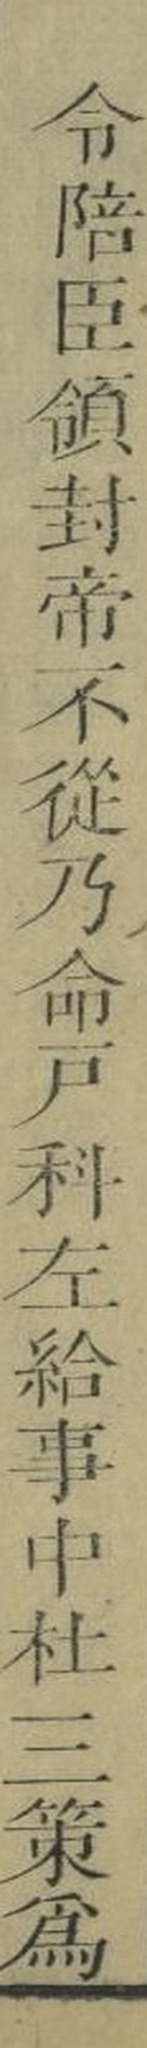令陪臣領封帝不従乃命戸科左給事中杜三策為
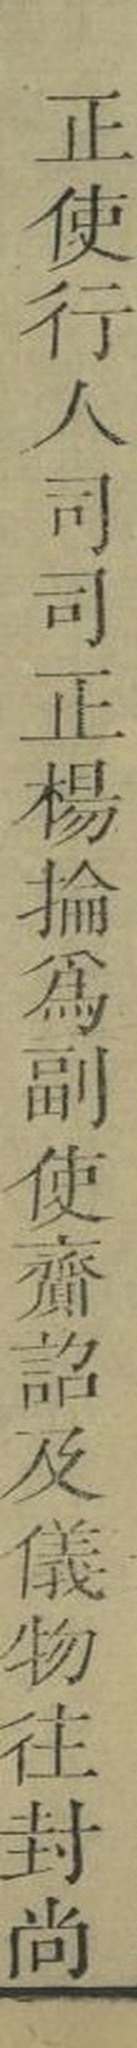正使行人司司正楊掄為副使齎詔及儀物往封尚
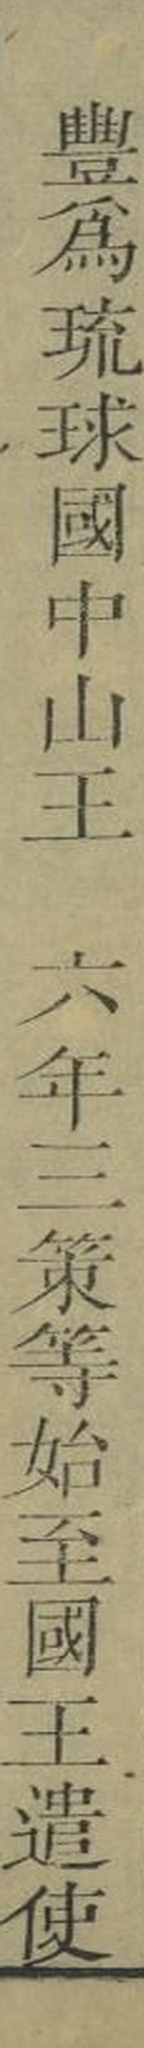豊為琉球国中山王六年三策等始至国王遣使
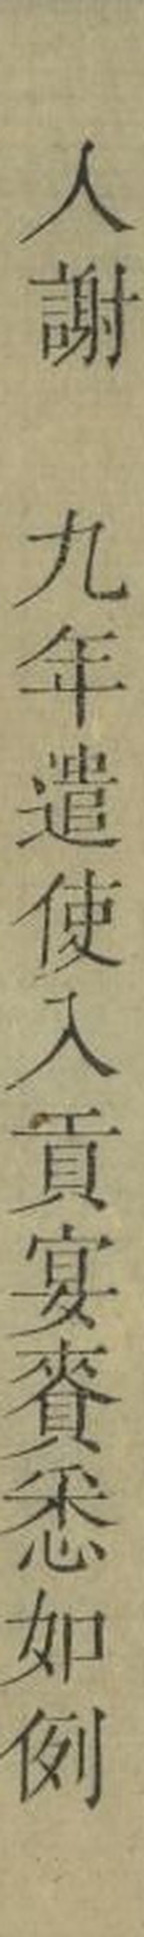入謝九年遣使入貢宴賚悉如例
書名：中山伝信録 巻三
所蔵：University of the Ryukyus Library
